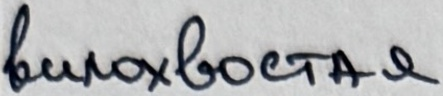вилохвостая
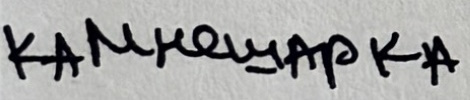камнешарка
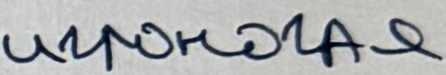иглоногая
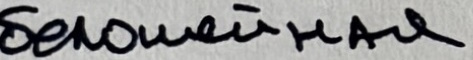белошейная
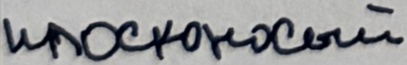плосконосый
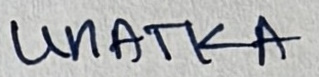ипатка
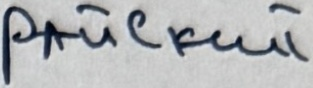райский
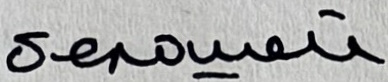белошей
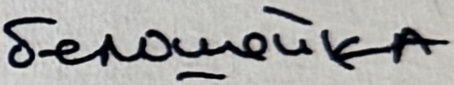белошейка
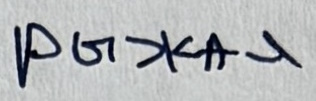рыжая
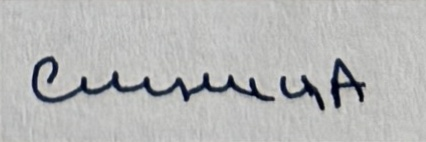синица
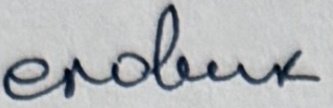еловик
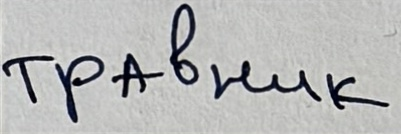травник
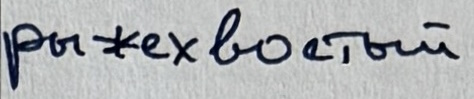рыжехвостый
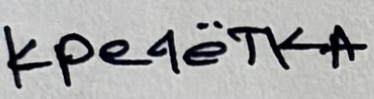кречётка
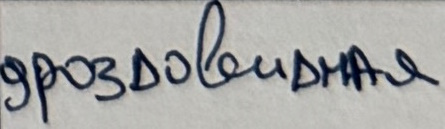дроздовидная
